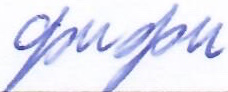фифи
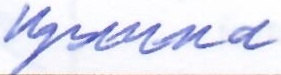крачка
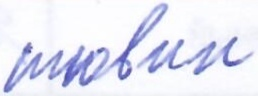тювик
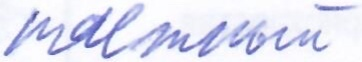таежный
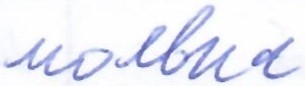моевка
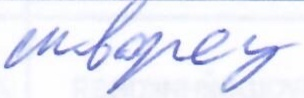скворез
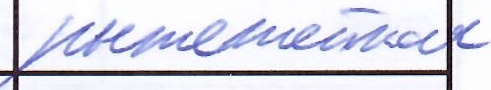рыжешейная
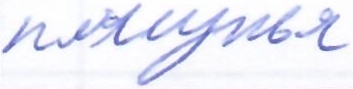плясунья
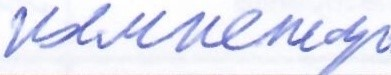камнешар
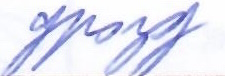дрозд
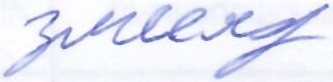змееяд
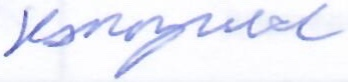копырка
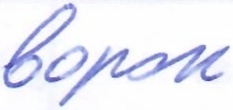ворок
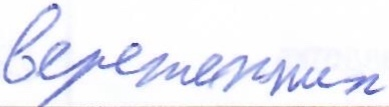веретеннип
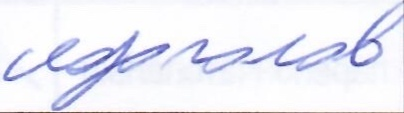седоголов
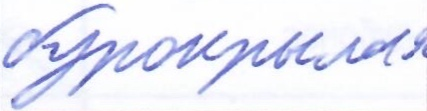бурокрылая
